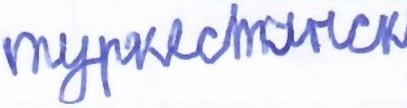туркестанск
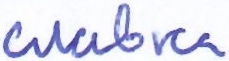славка
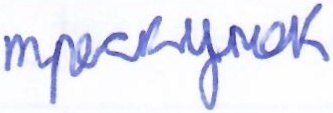трескунок
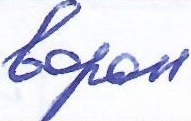ворон
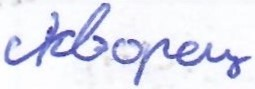скворец
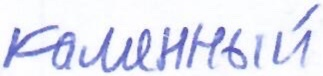каменный
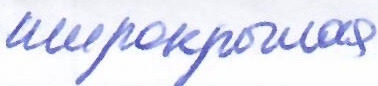широкрылая
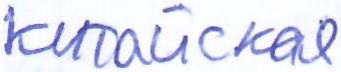китайская
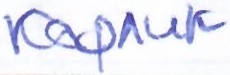карлик
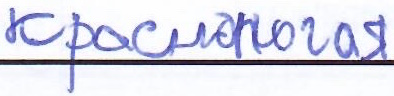красноногая
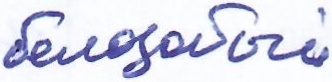белозобый
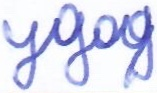удод
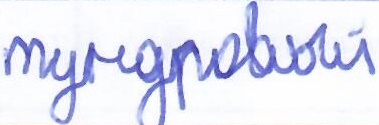тундровый
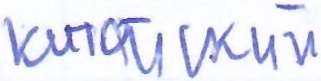китайский
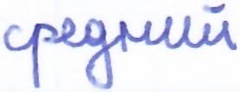средний
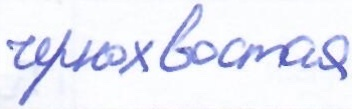чернохвостая
